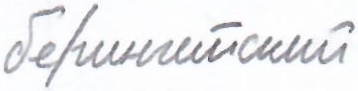берингийский
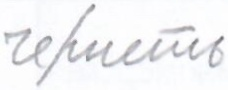чернеть
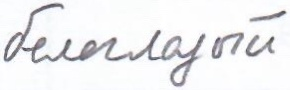белоглазый
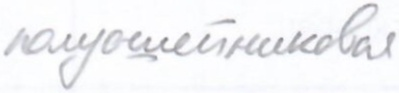полуошейниковая
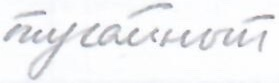тугайный
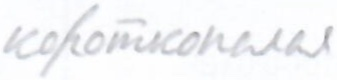короткопалая
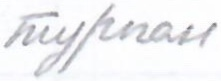турпан
